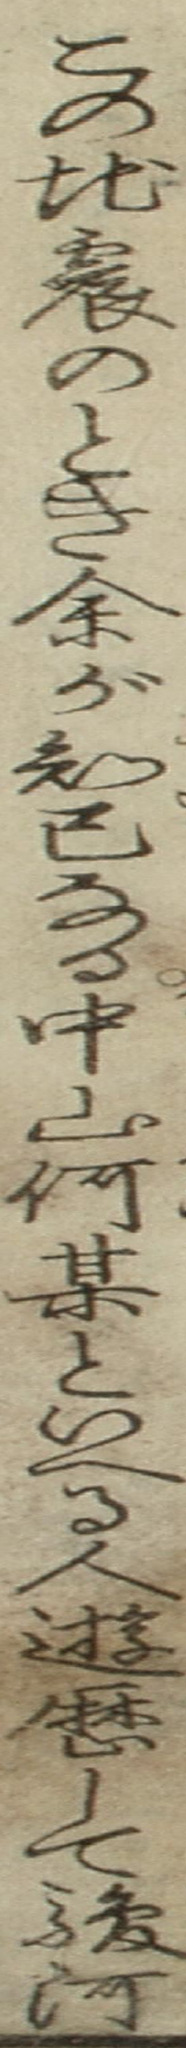この地震のとき余が知己なる。中山某といへる人。遊歴して駿河
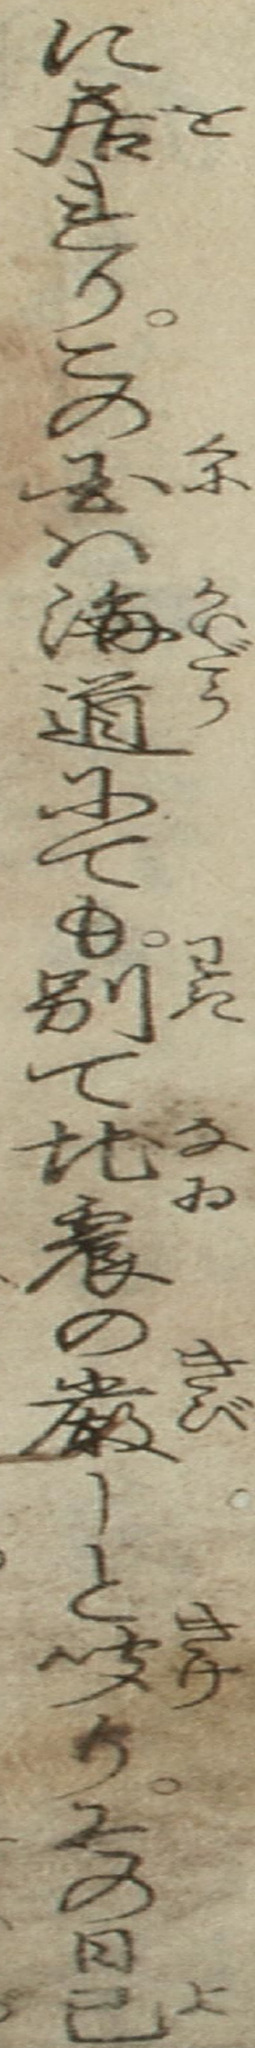に居れり。この国は海道にても別て地震の厳しと聞り。その日已
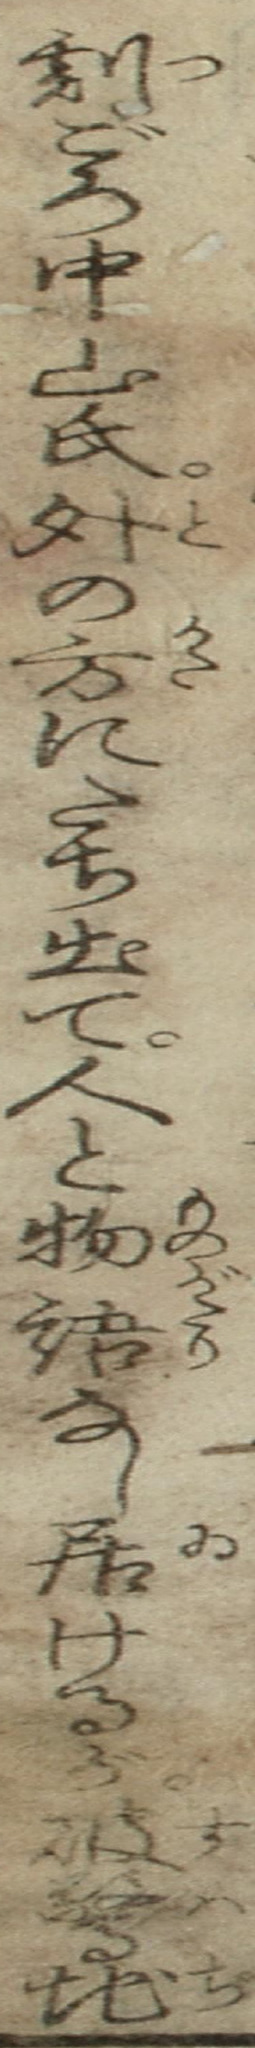刻ごろ中山氏。外の方にたち出て。人と物語なし居けるが破驚地

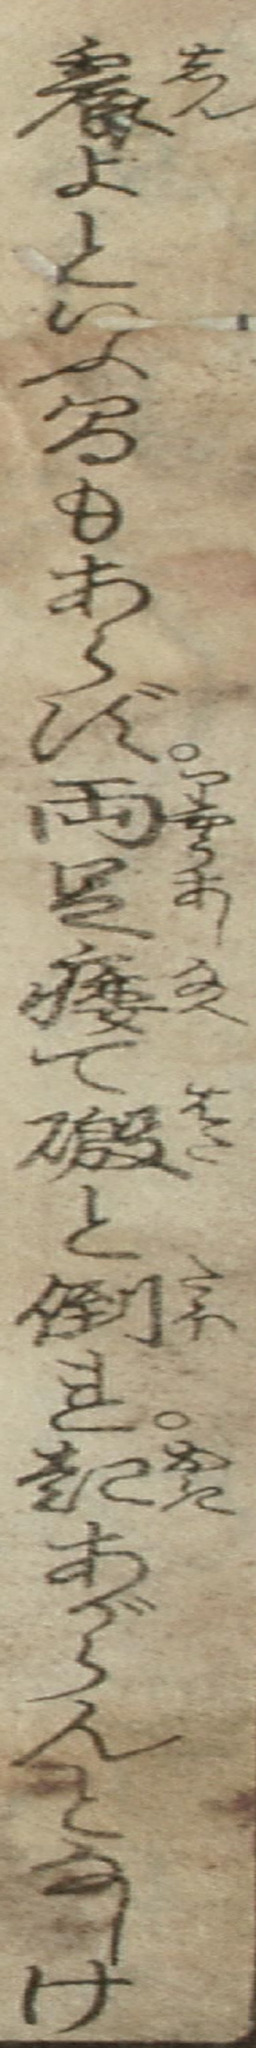震よといふ間もあらず。両足痿て磤と倒れ。起あがらんとなしけ
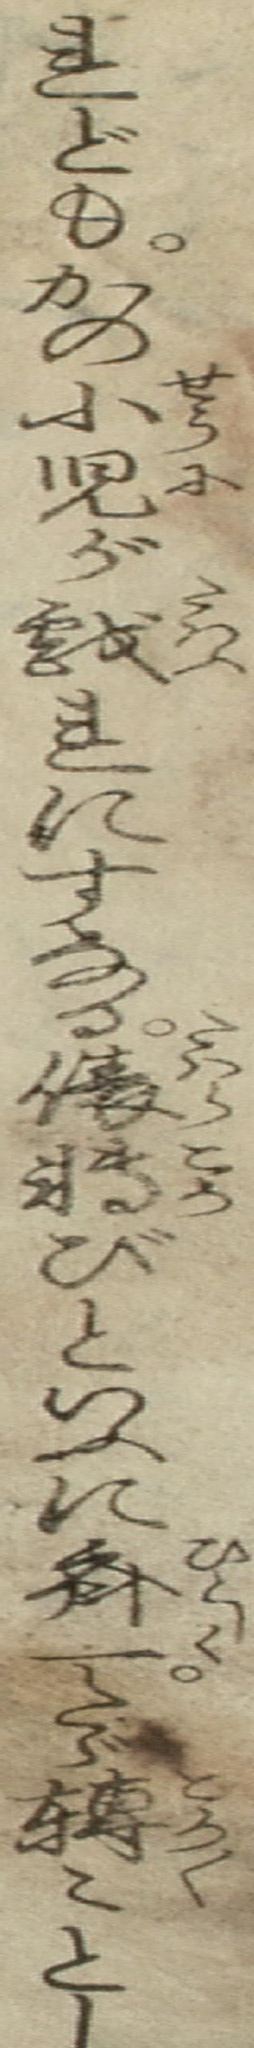れども。かの小児が戯れにすなる。俵転びといふに斉一。たゞ転々とし
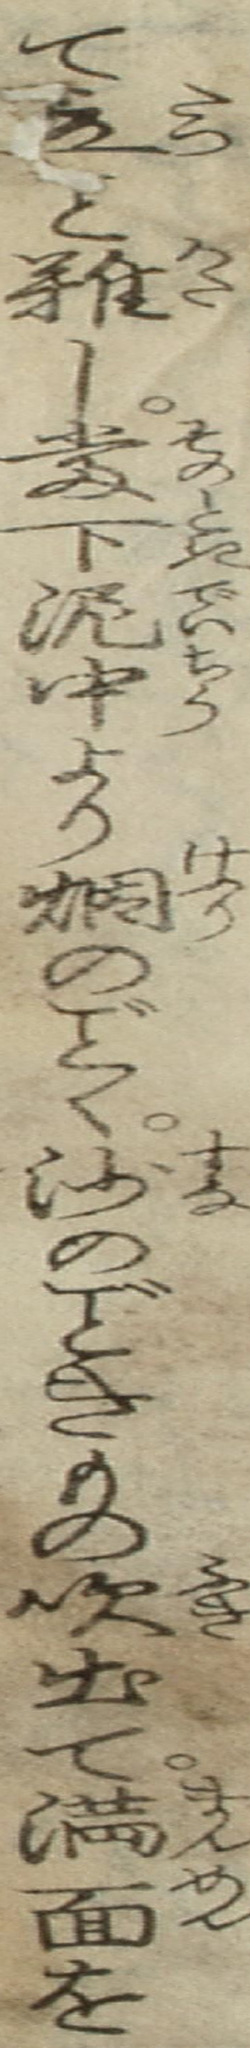て立こと難し。当下泥中より烟のごとく。沙のごときもの吹出て。満面を
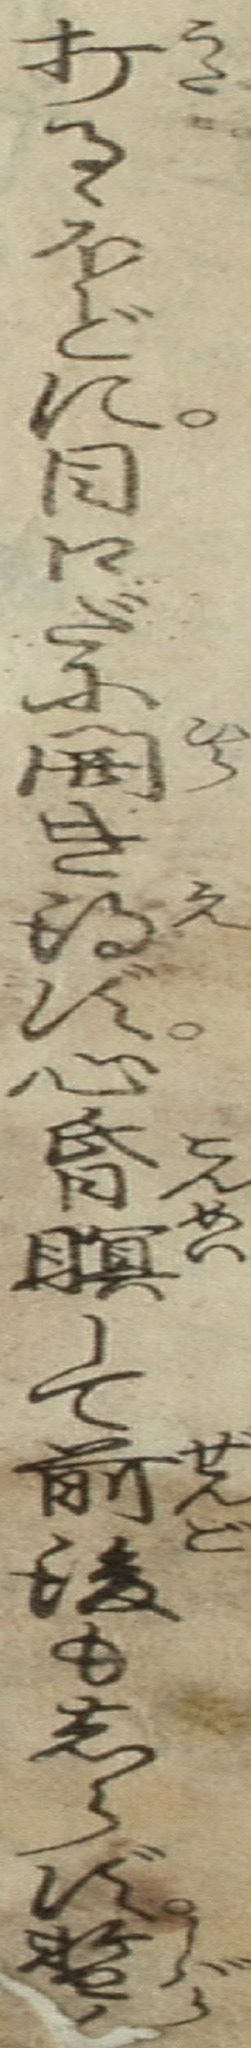打るゝほどに。目口だに開き得ず。心昆瞑して前後もしらず。暫く
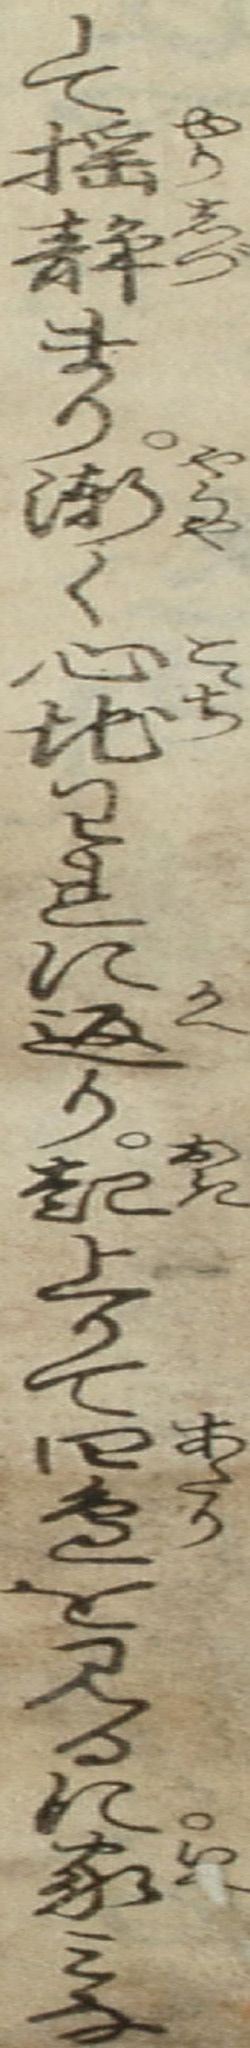して揺静まり。漸く心地われに返り。起上りて四辺を見るに。家みな
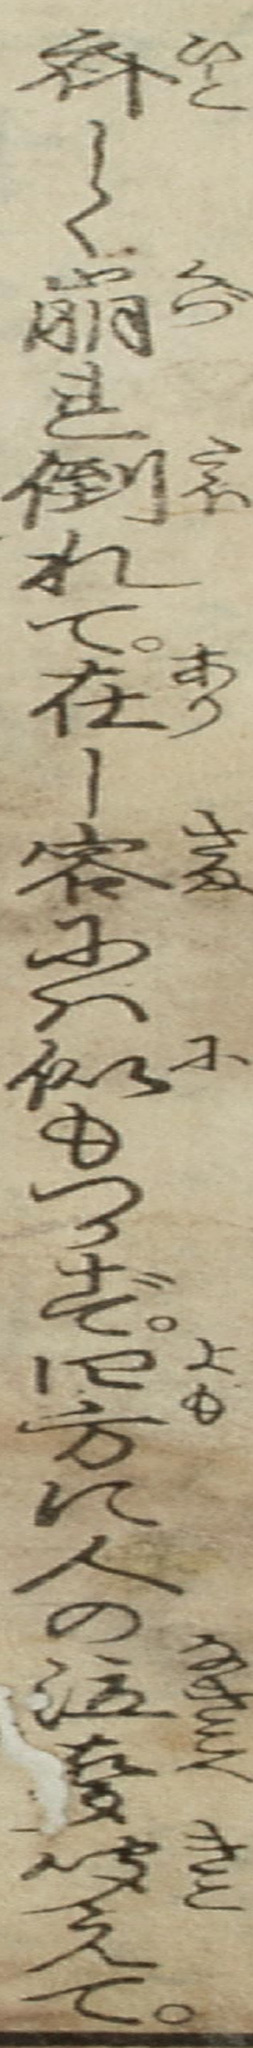斉しく崩れ倒れて在し容には似もつかず。四方に人の泣声聞えて。
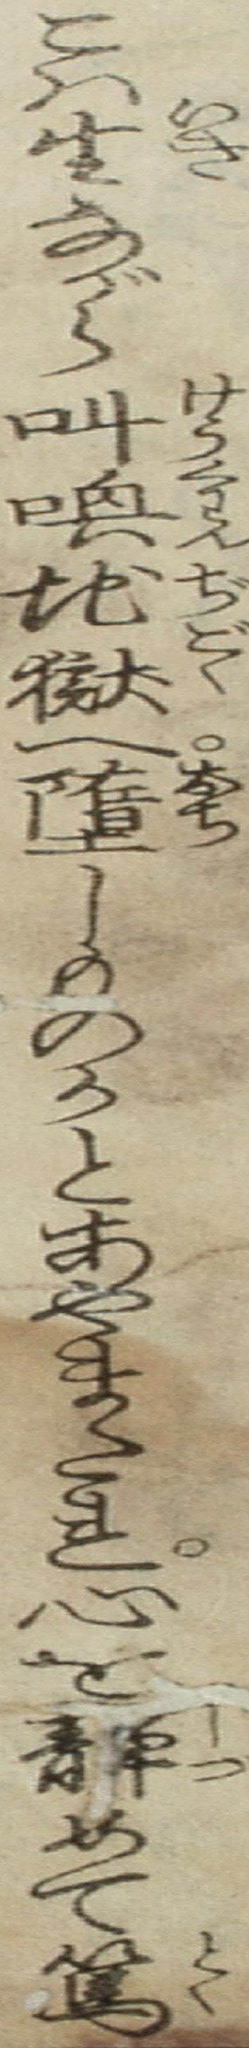こは生ながら叫喚地獄へ堕しものかとあやまたれ。心を静めて篤
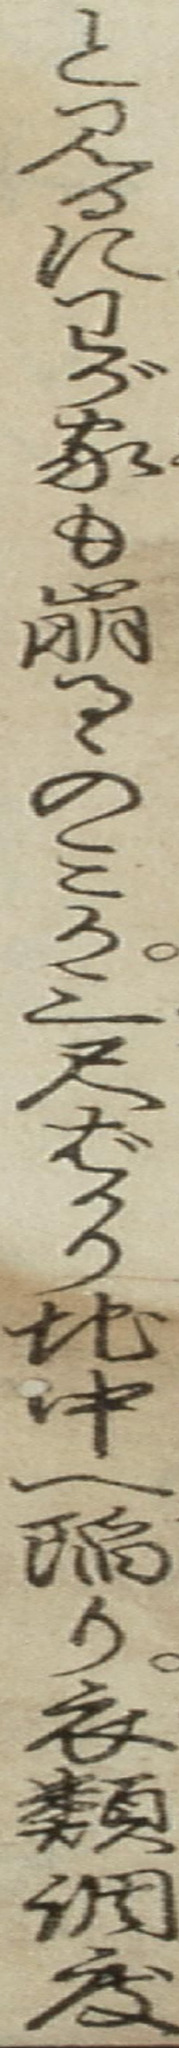と見るに。わが家も崩るゝのみか。三尺ばかり地中へ陥り。衣類調度
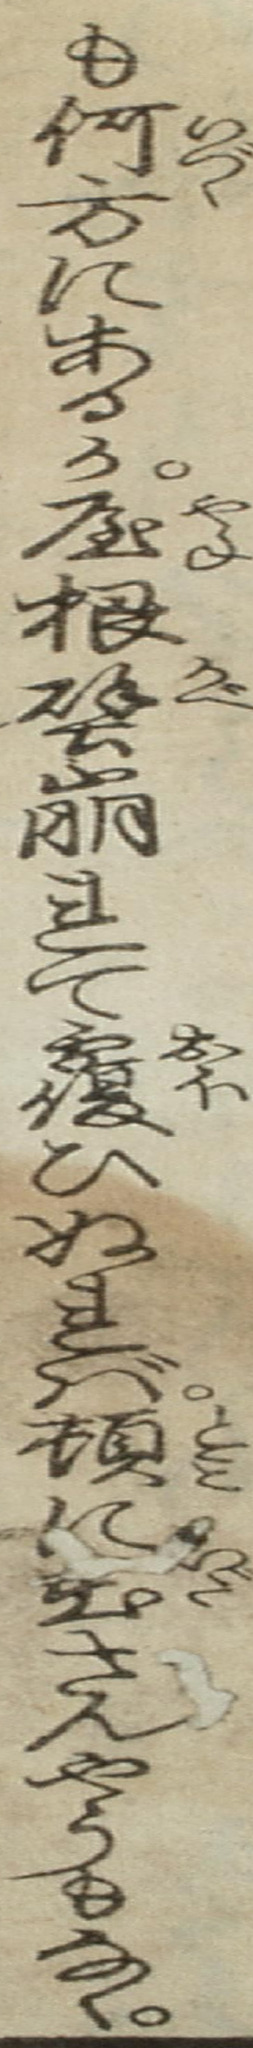も何方にあるか。屋根壁崩れて覆ひぬれば。頓に出さんやうもなく。
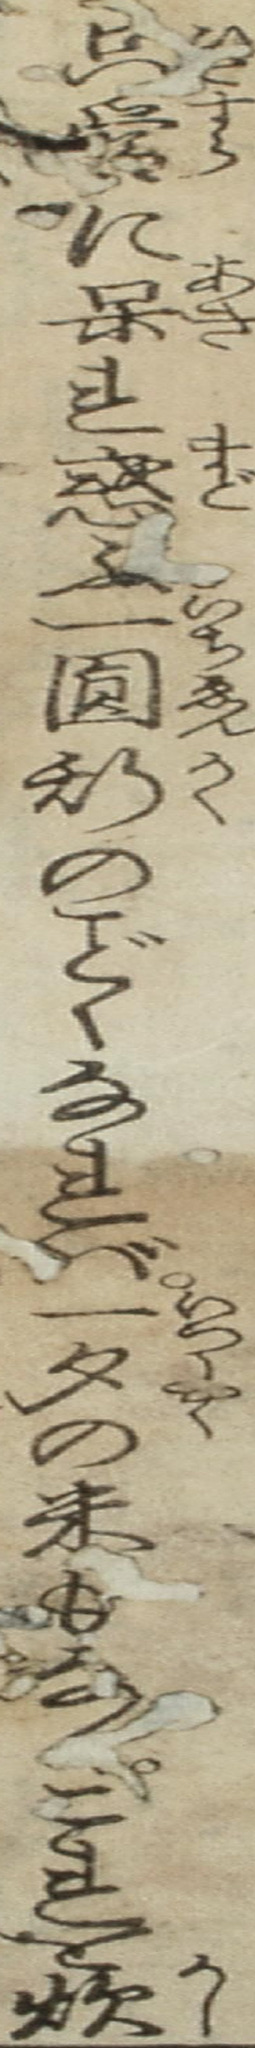只管に呆れ惑ふ。一円斯のごとくなれば。一夕の米もなく。これを炊
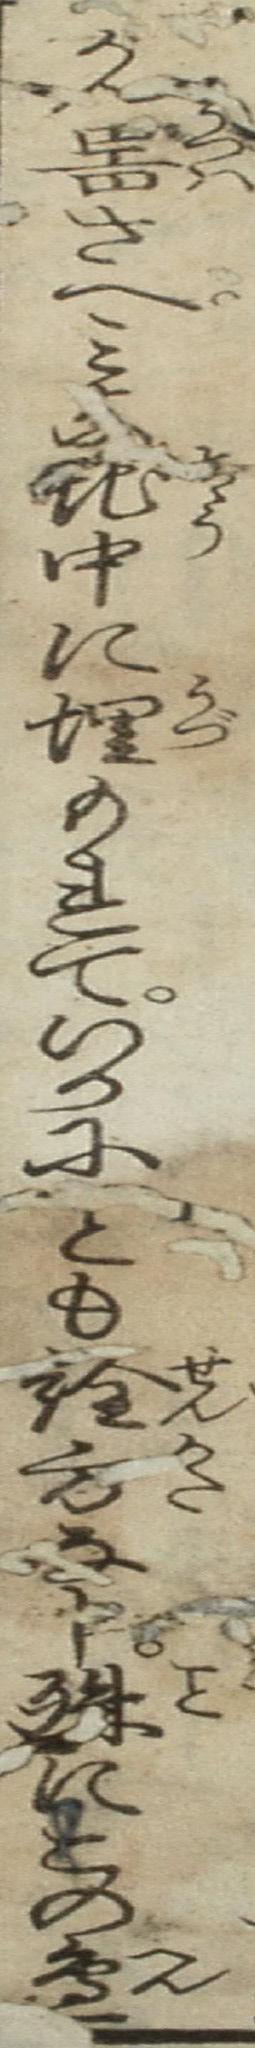かん器さへみな地中に埋もれて。いかにとも詮方なし。殊にこの辺
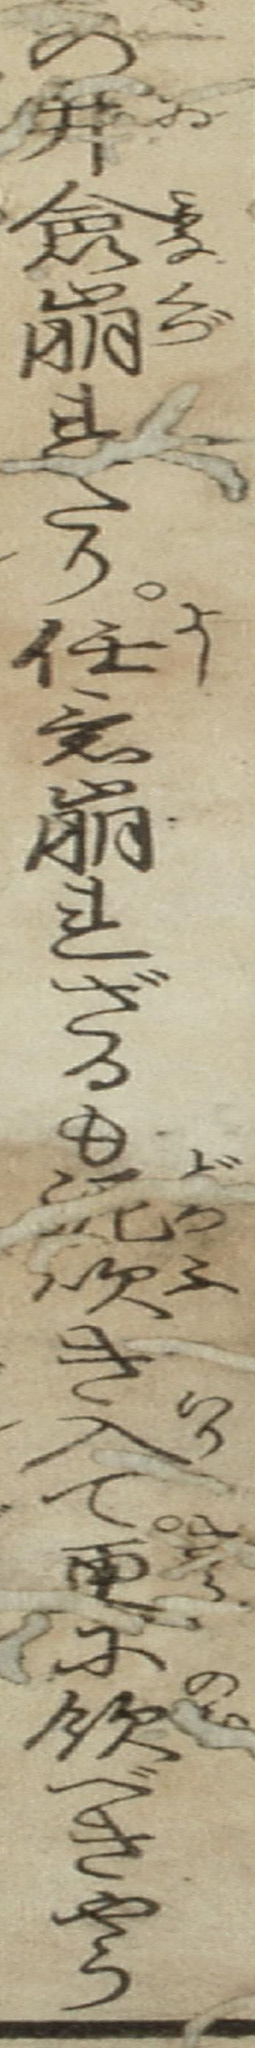の井崩れたり。任意崩れざるも泥吹き入て更に飲べきやう
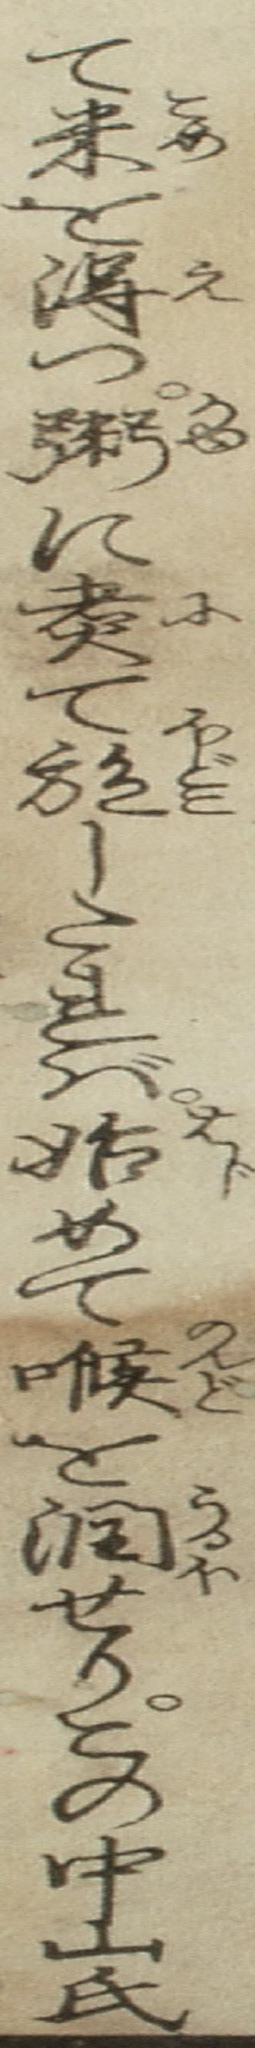て米を得つ。粥に煮て施したれば。始めて喉を潤せり。この中山氏
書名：安政見聞録　中
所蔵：東京大学地震研究所図書室 Earthquake Research Institute Library, The University of Tokyo, JAPAN
